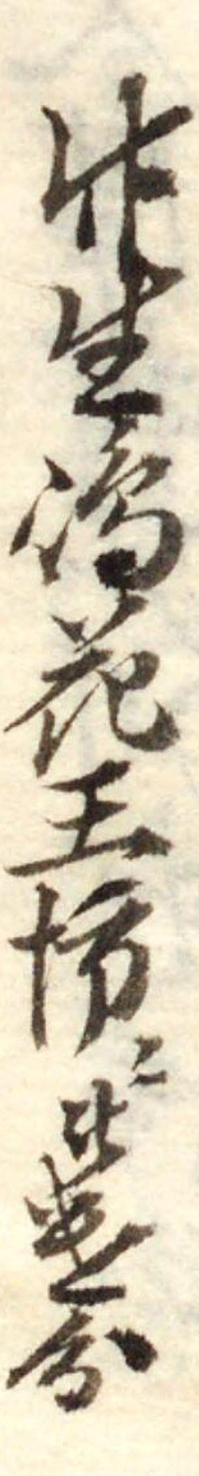竹生島花王坊に被遣分
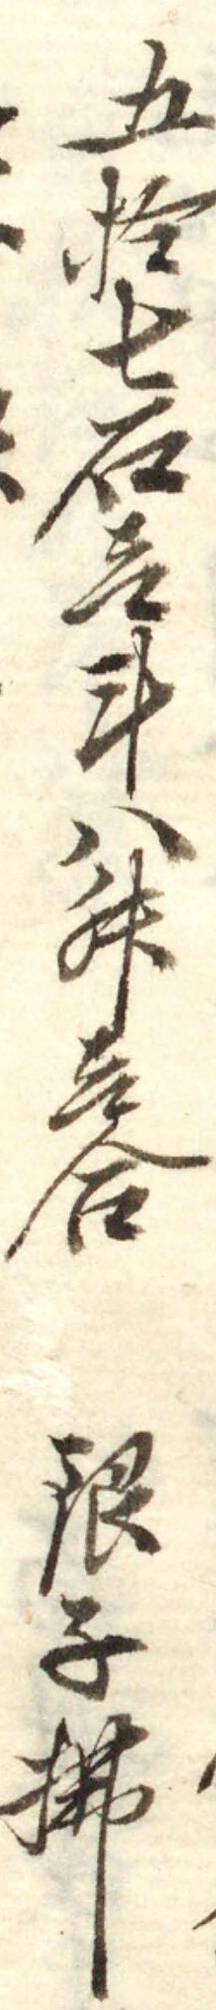五拾七石壹斗八升壹合銀子払
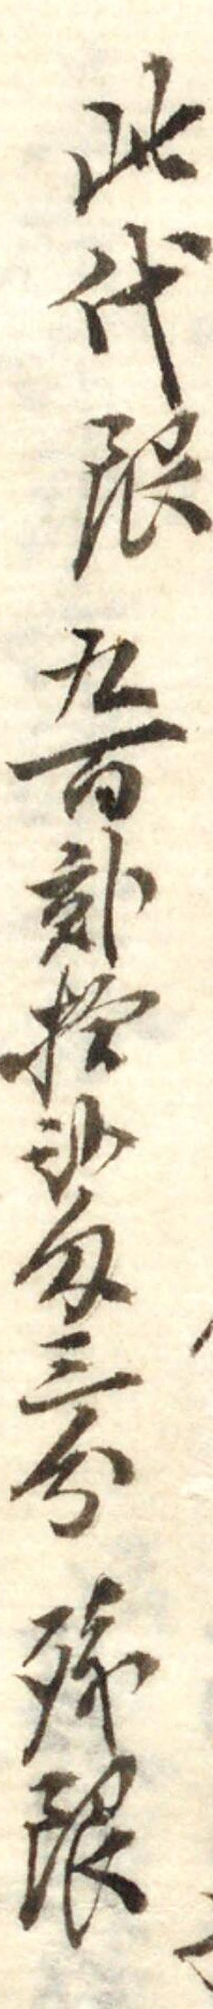此代銀九百貳拾貳匁三分残銀
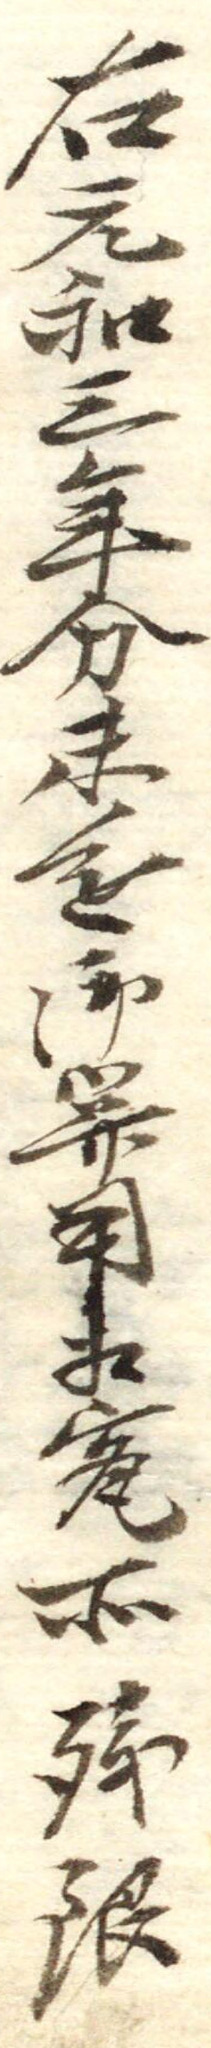右元和三年分未進御算用相究所残銀
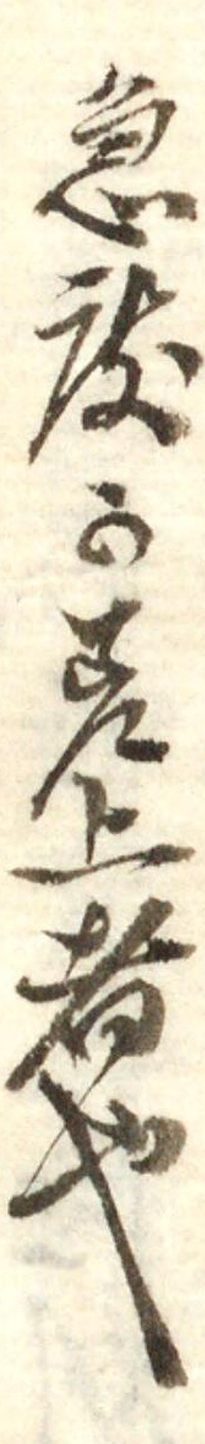急度可差上者也
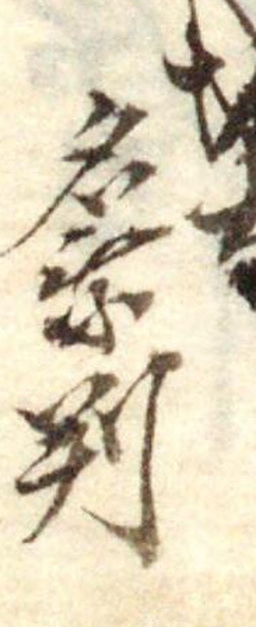名乗判

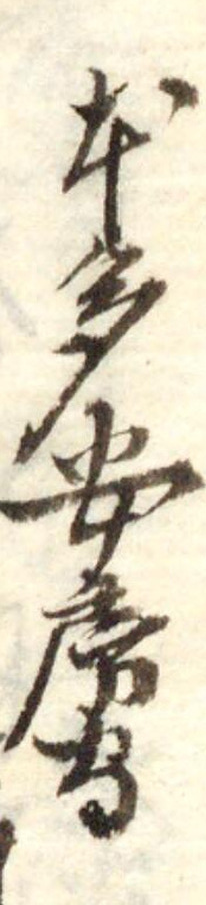本多安房守
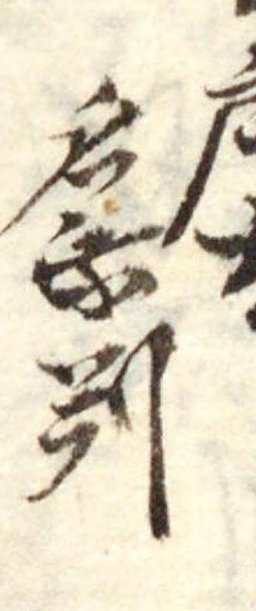名乗判
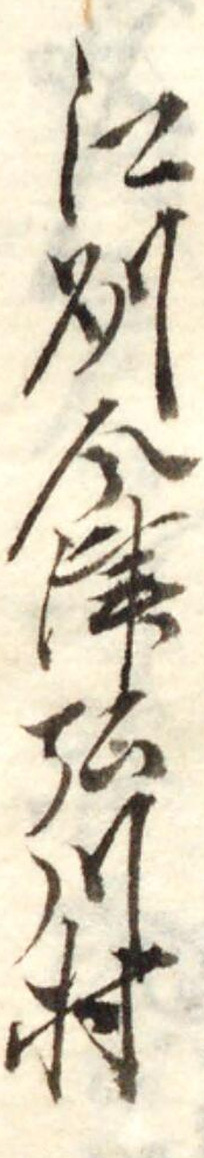江州今津弘川村
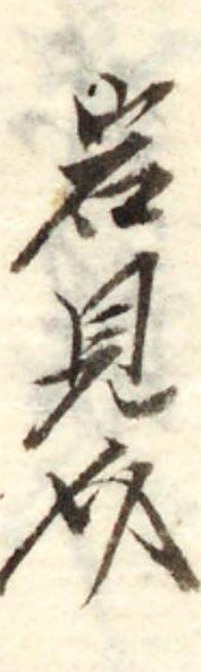岩見介
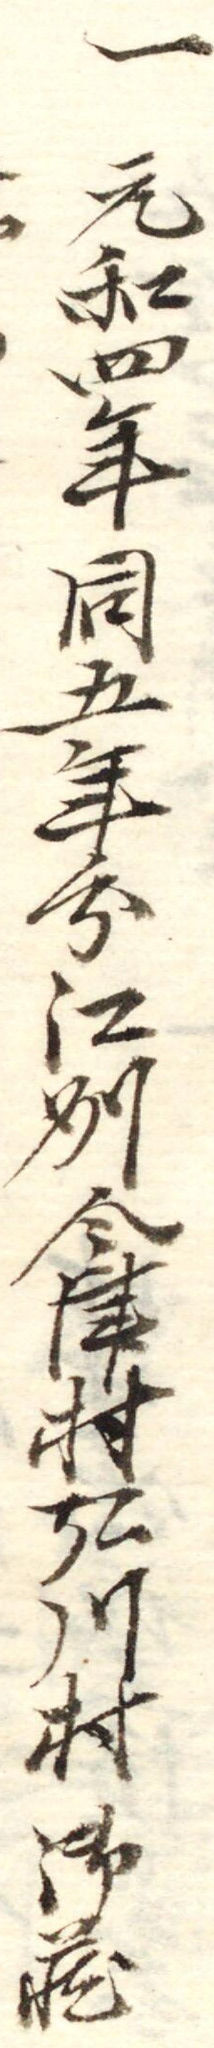一元和四年同五年分江州今津村弘川村御蔵
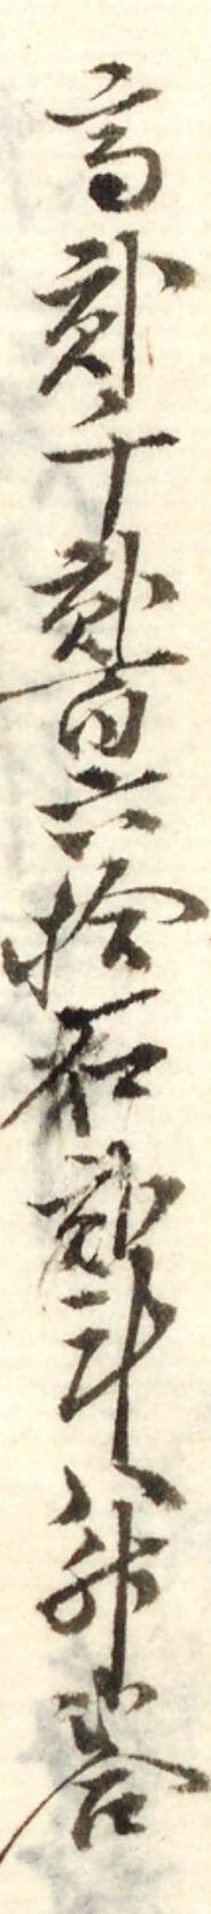高貳千貳百六拾石貳斗八升貳合
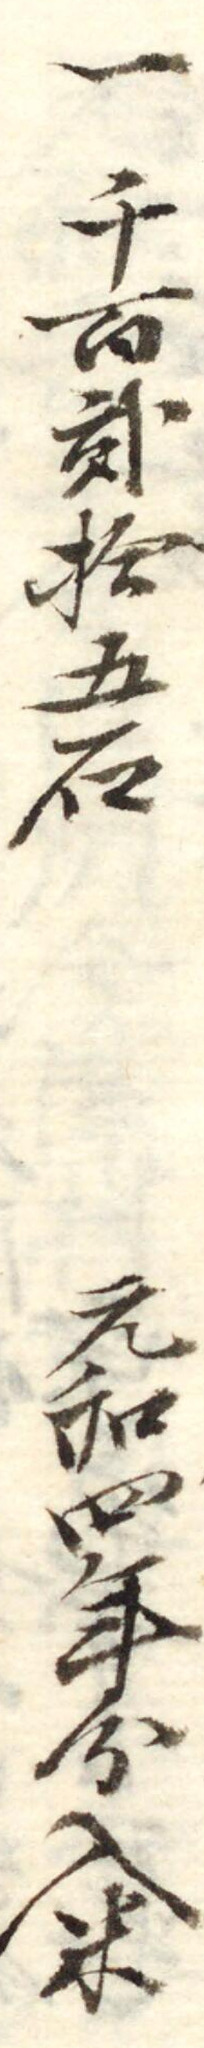一先百貳拾五石元和四年分入米
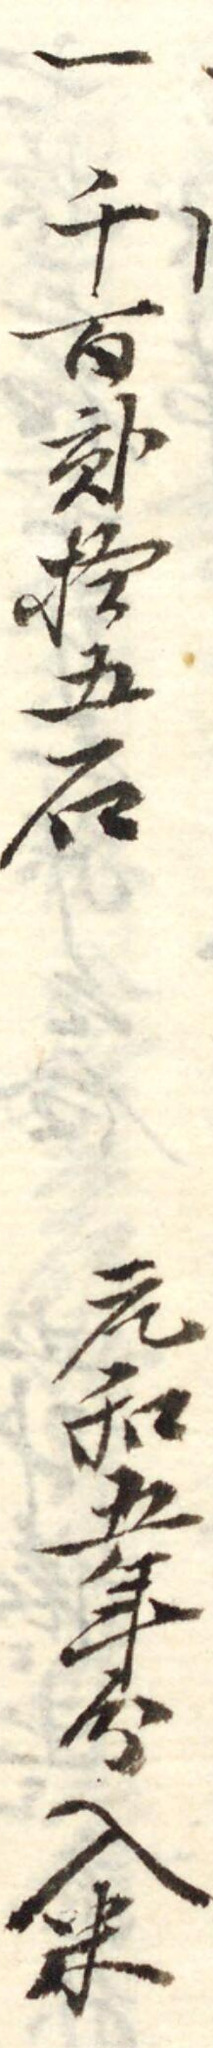一先百貳拾五石元和五年分入米
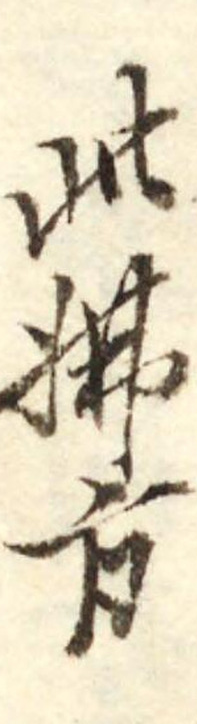此払方
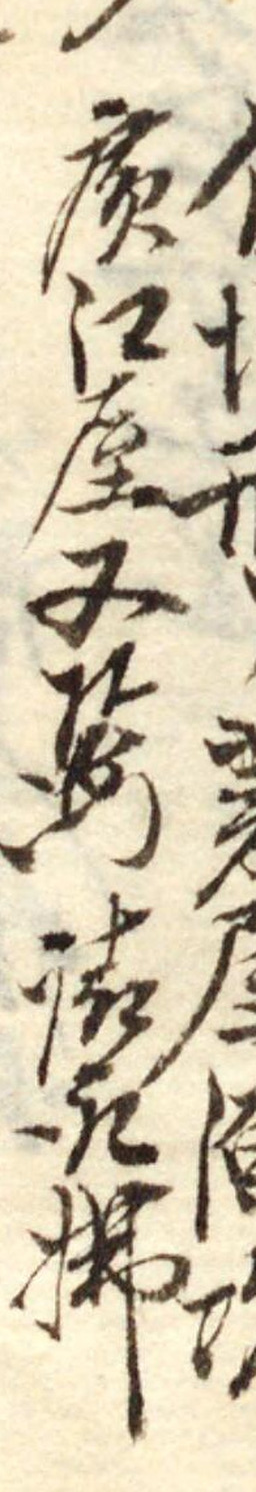廣江屋又左衛門請取払
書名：前田家封国証書集録
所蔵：Ishikawa Prefectural Library
